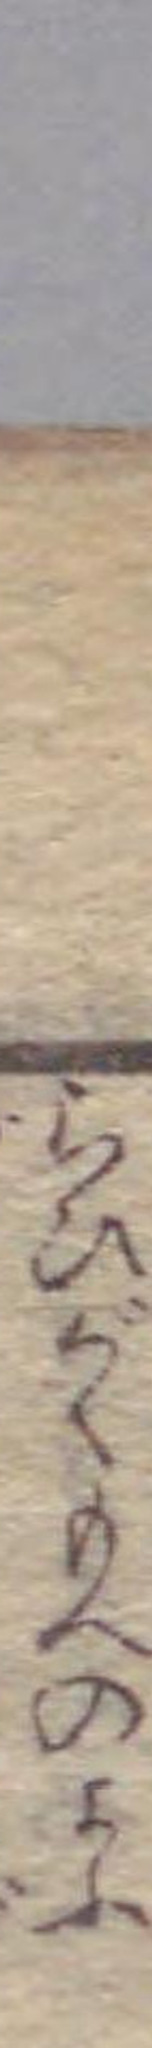らひがくもんのよふ
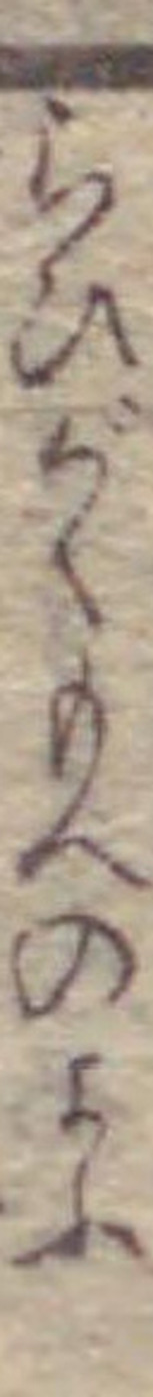らひがくもんのよふ
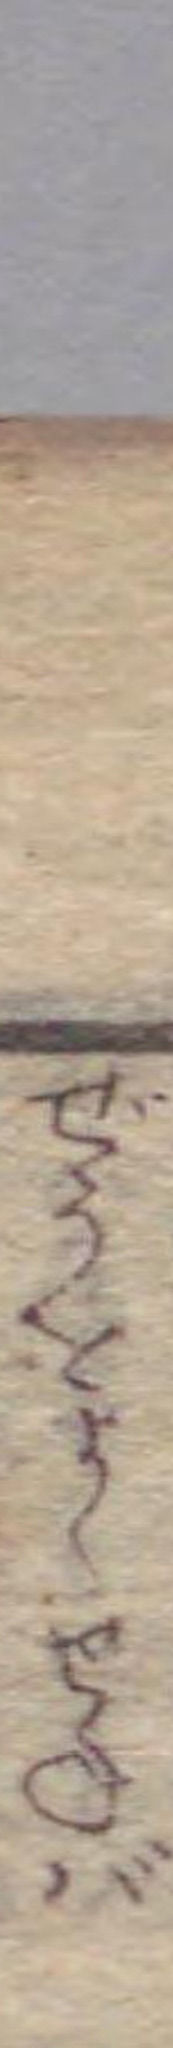ぜうをよくせねば
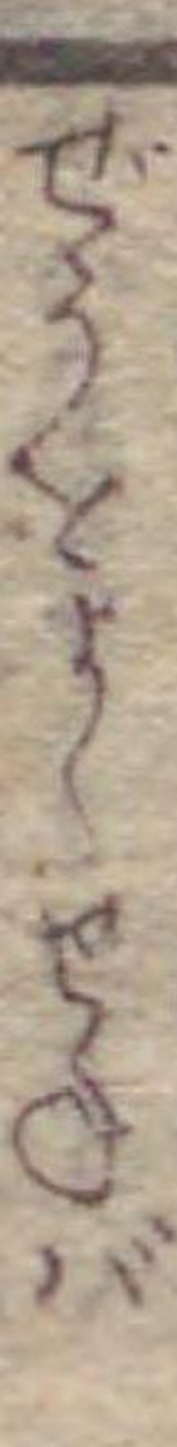ぜうをよくせねば
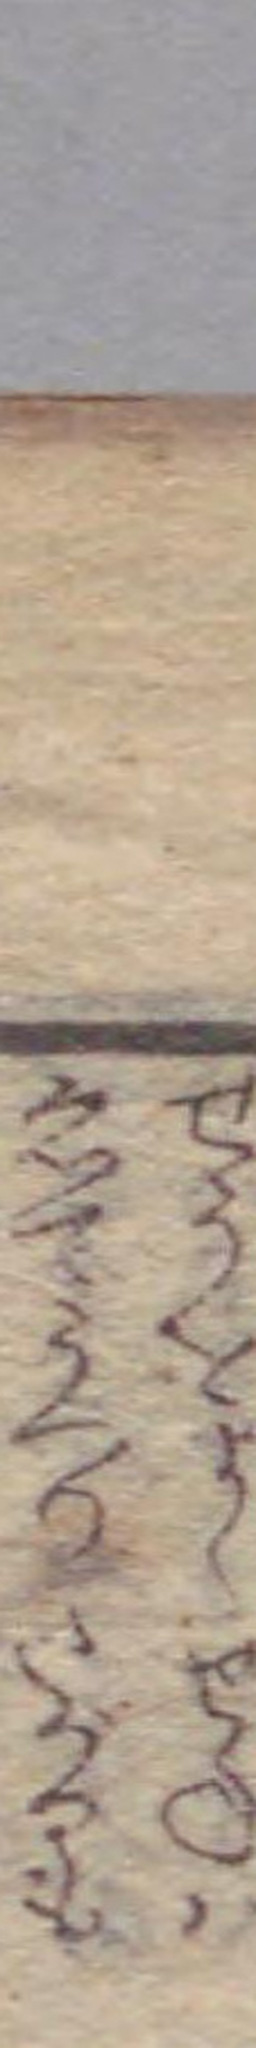かつてうつりたがるも
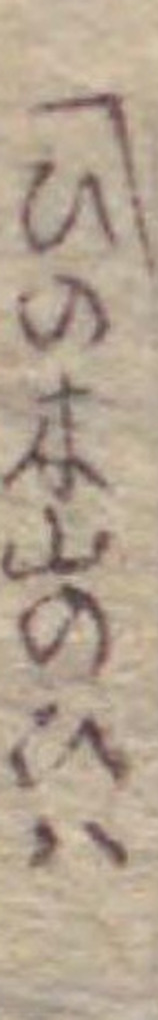〽ひの木山のひは
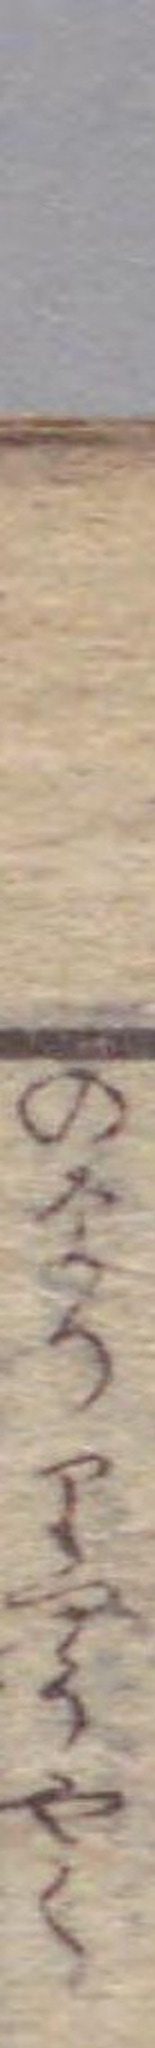のなりりやうやく
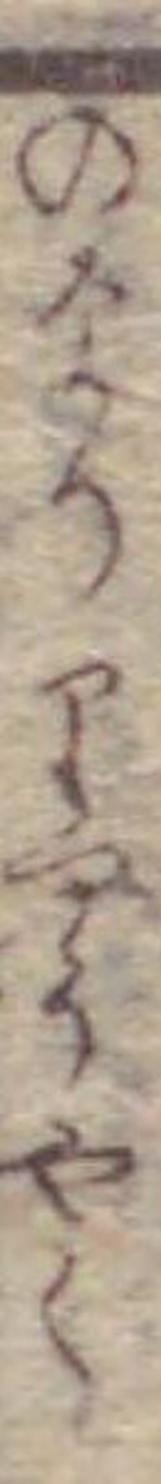のなりりやうやく
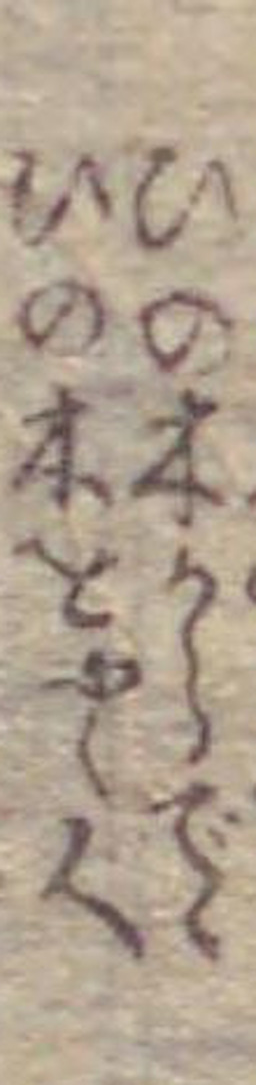ひの木をやく人
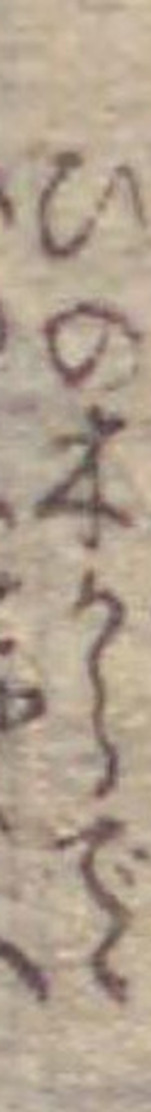ひの木からでゝ
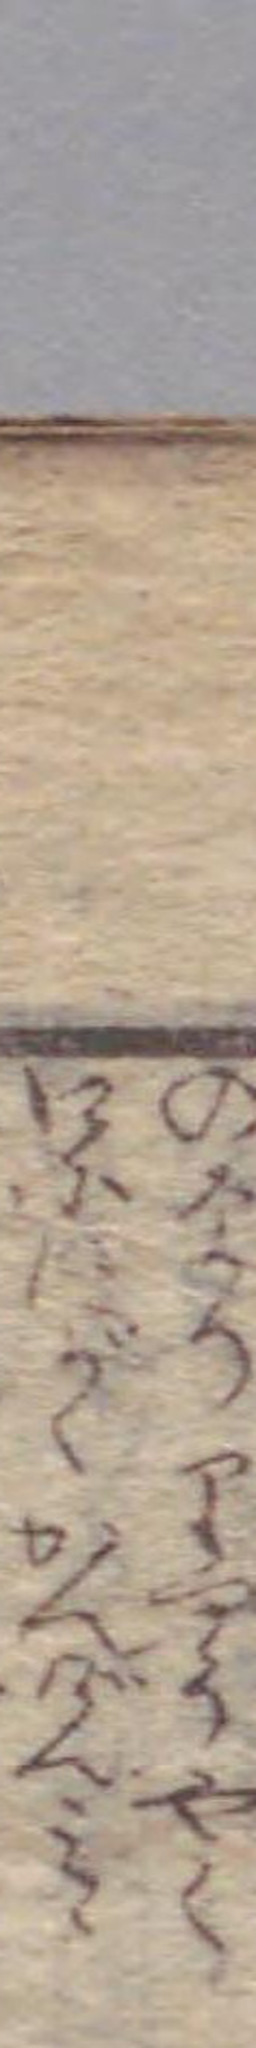口ににがくかんげんみゝ
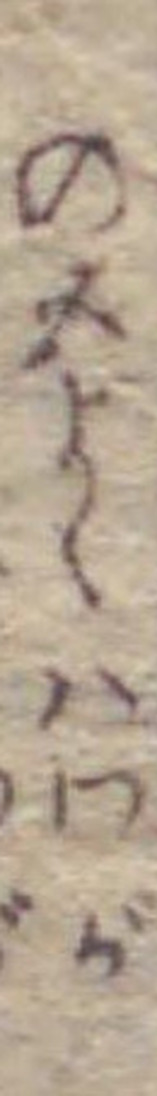の五よくはわが
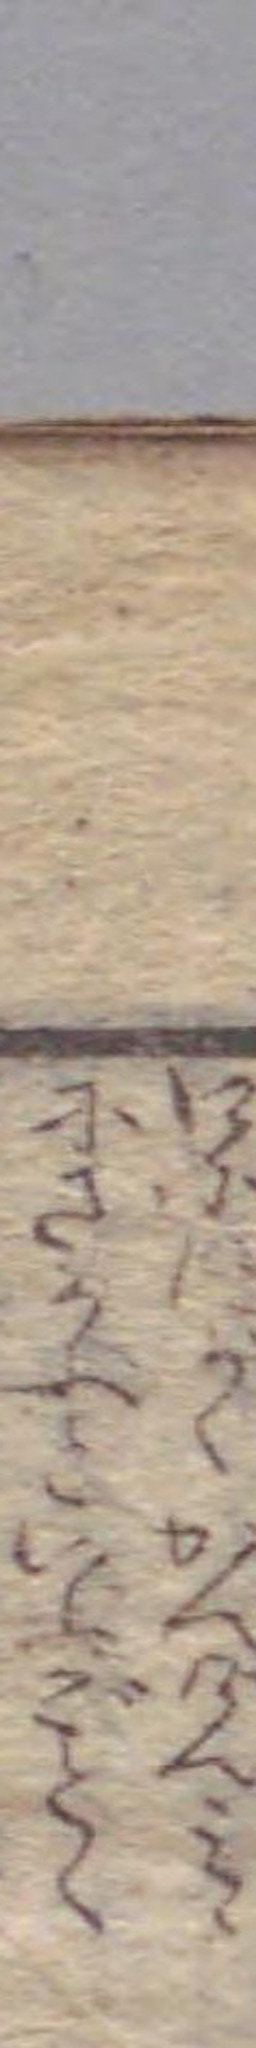にさかふといふごとく
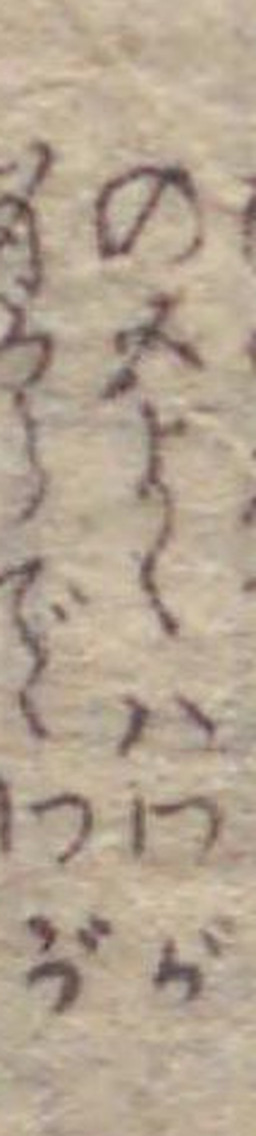身からでゝわが
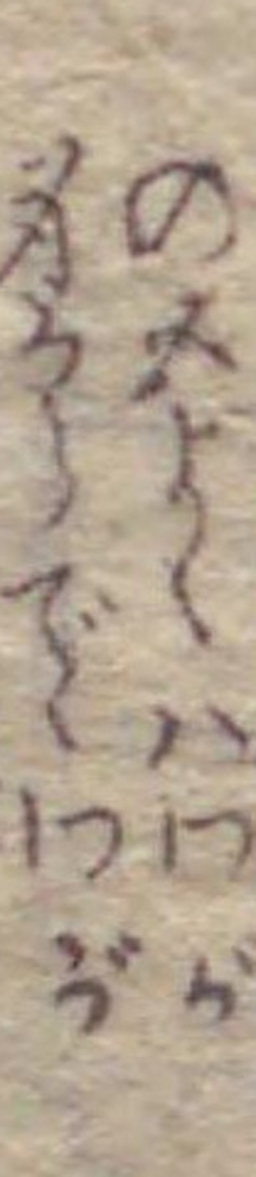身からでゝわが
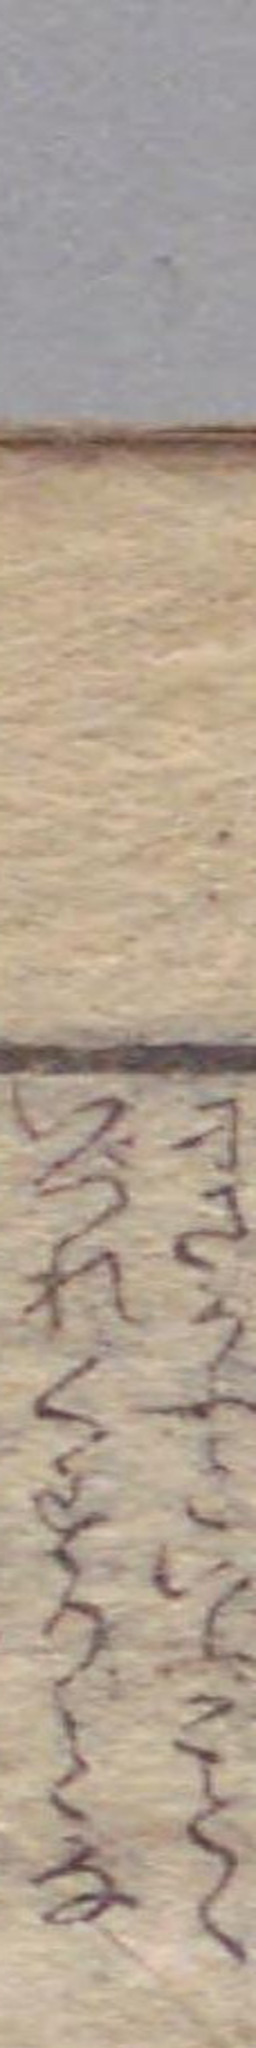いづれくすりとな
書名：鼻下長生薬 : 3巻
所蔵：国立国会図書館 National Diet Library, JAPAN
